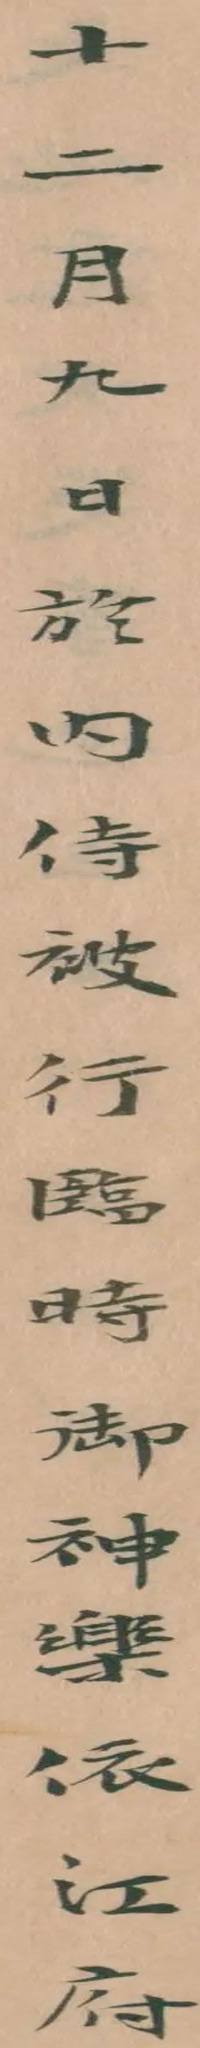十二月九日於内侍被行臨時御神楽依江府

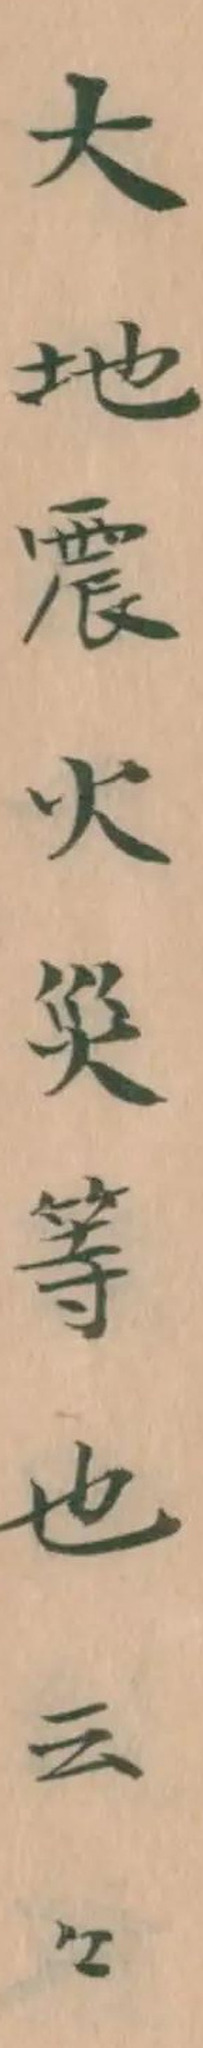大地震火災等也云々
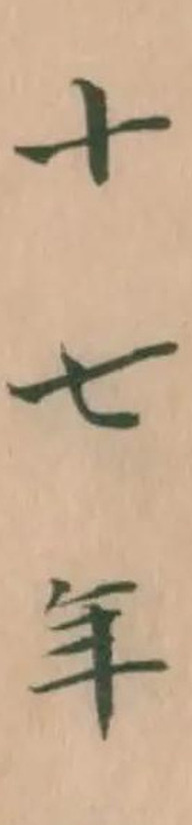十七年
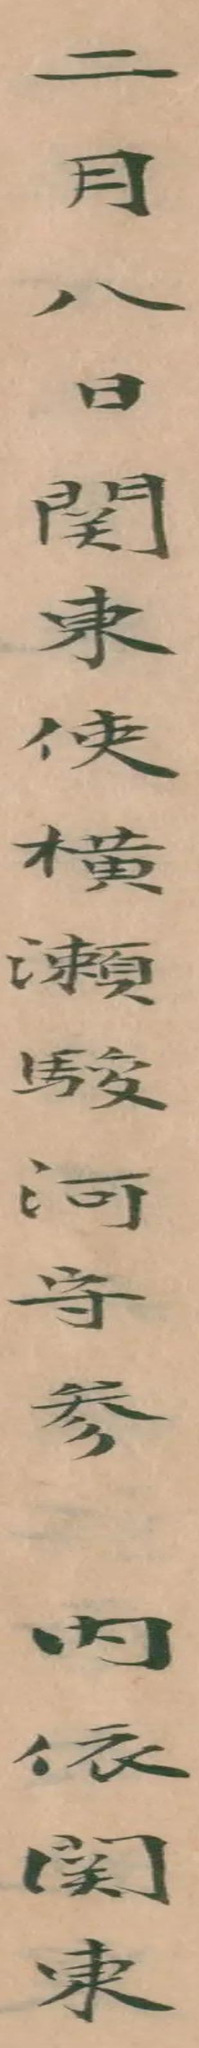二月八日関東使横瀬駿河守参内依関東
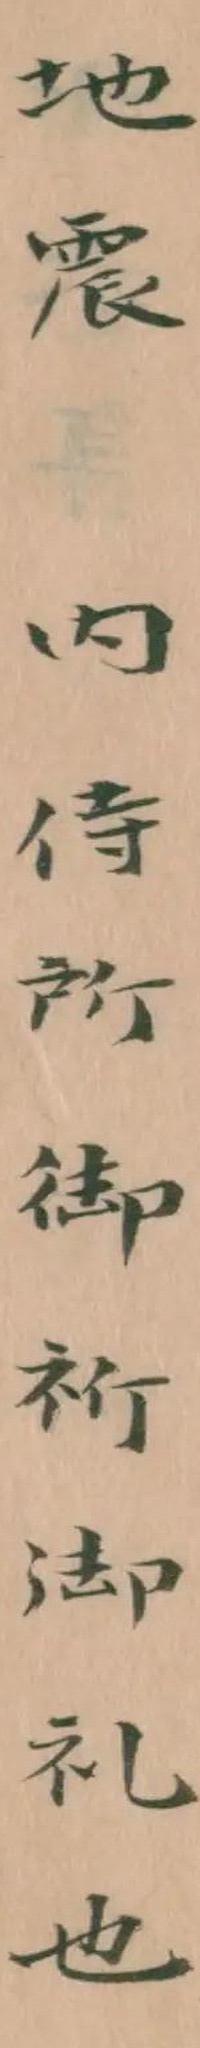地震内侍所御祈御礼也
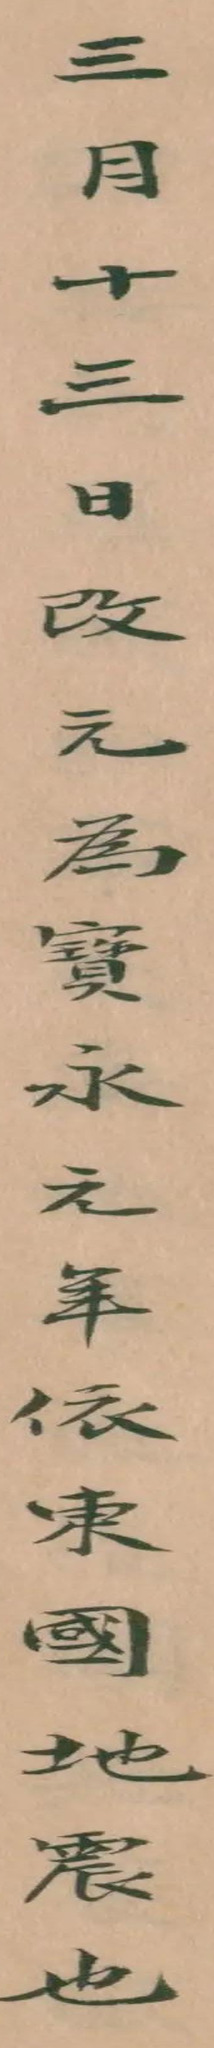三月十三日改元為宝永元年依東国地震也
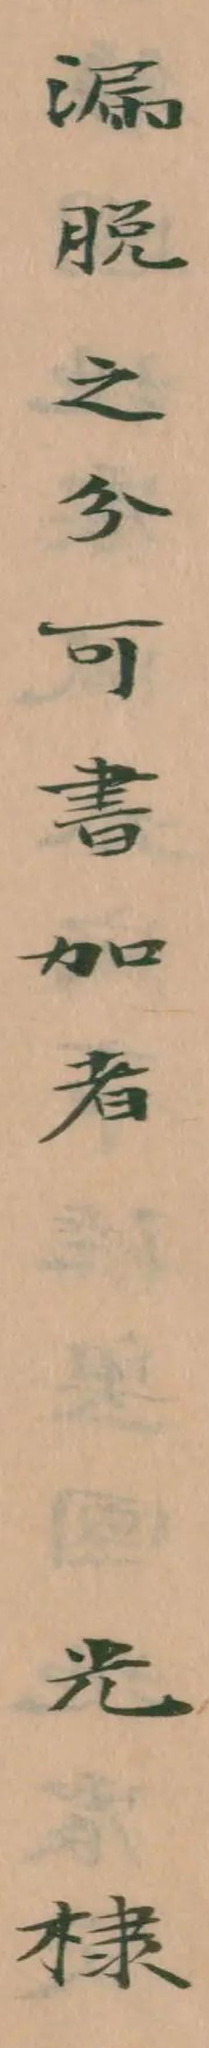漏脱之分可書加者光棣
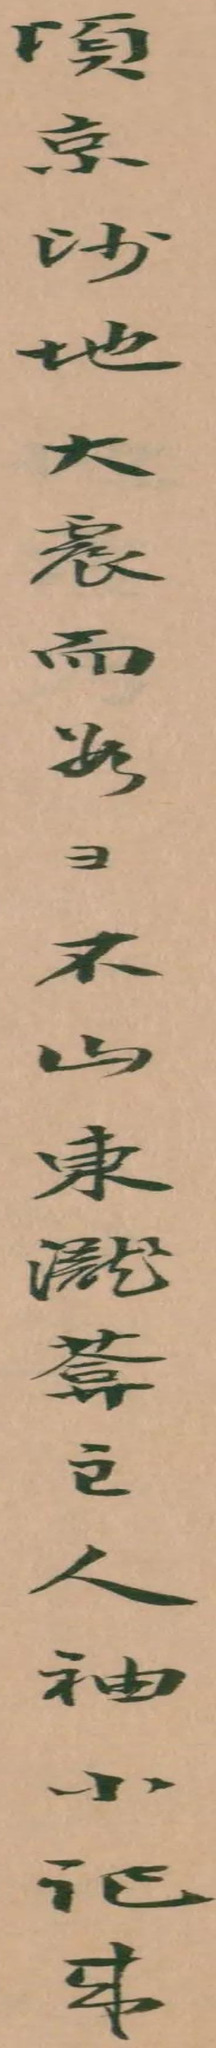頃京沙地大震而数ヨ不山東瀧菴主人袖小記来
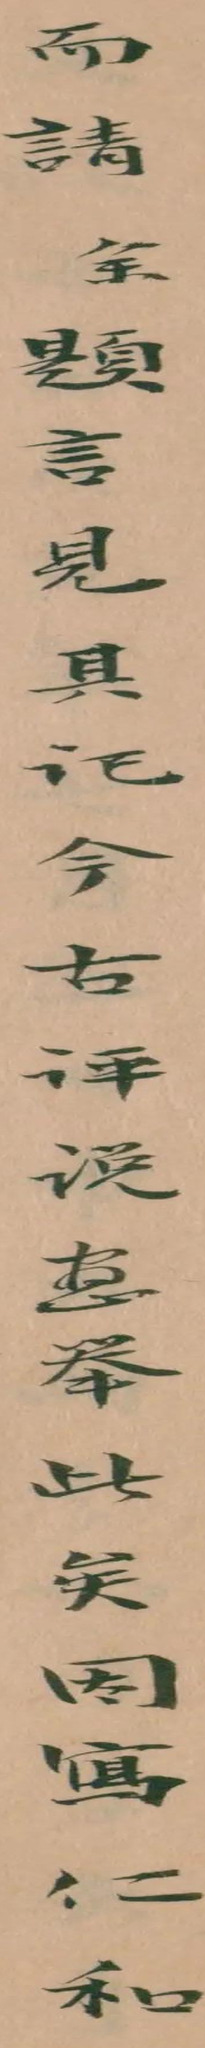而請余題言見其記今古評説惣挙此矣因写仁和
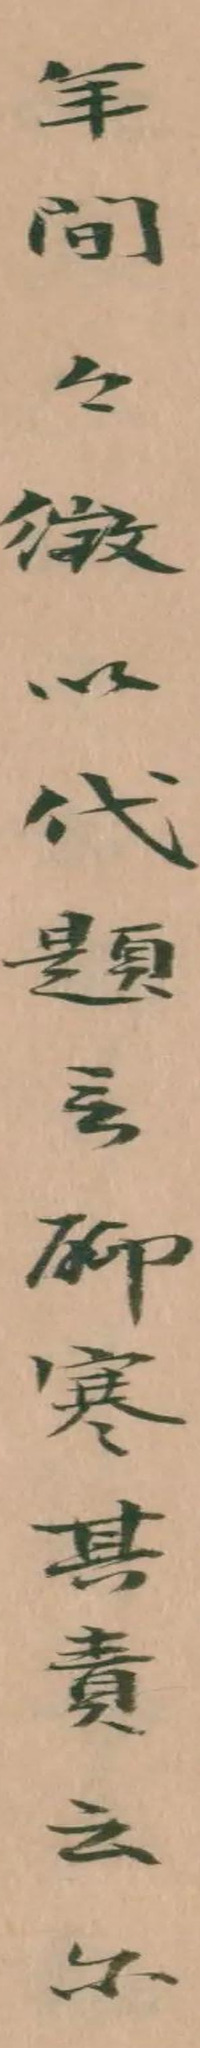年間々徴以代題言聊寒其責云尓
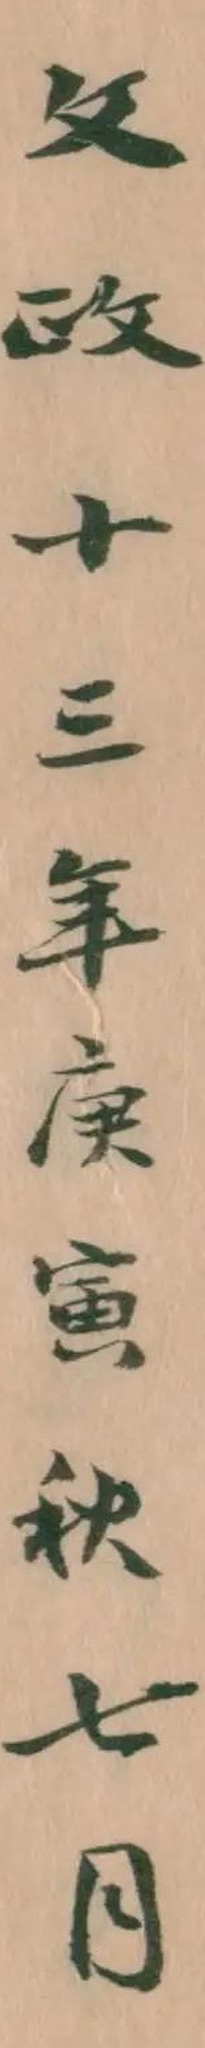文政十三年庚寅秋七月

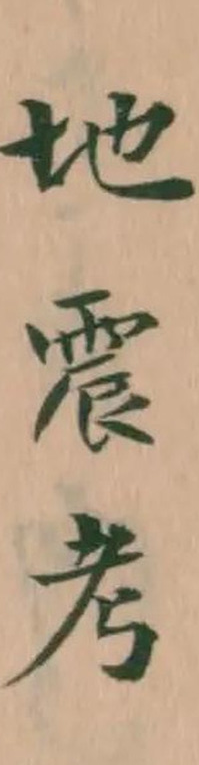地震考
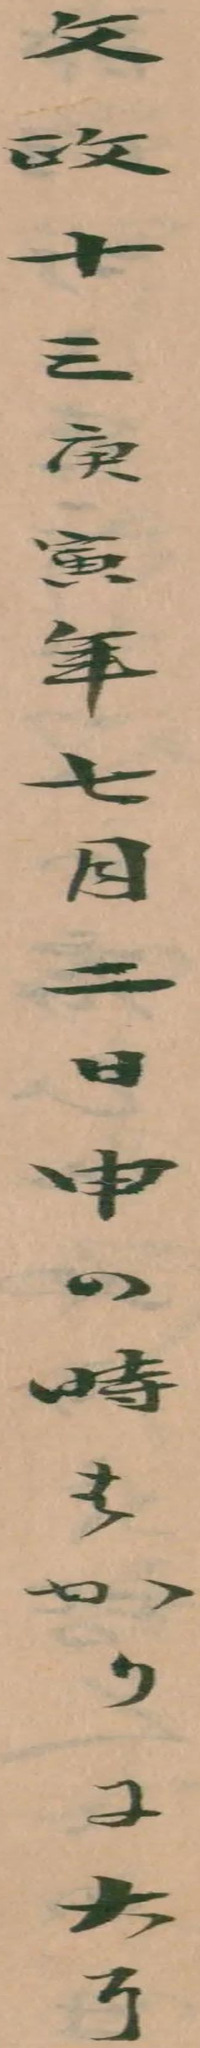文政十三庚寅年七月二日申の時はかりに大に
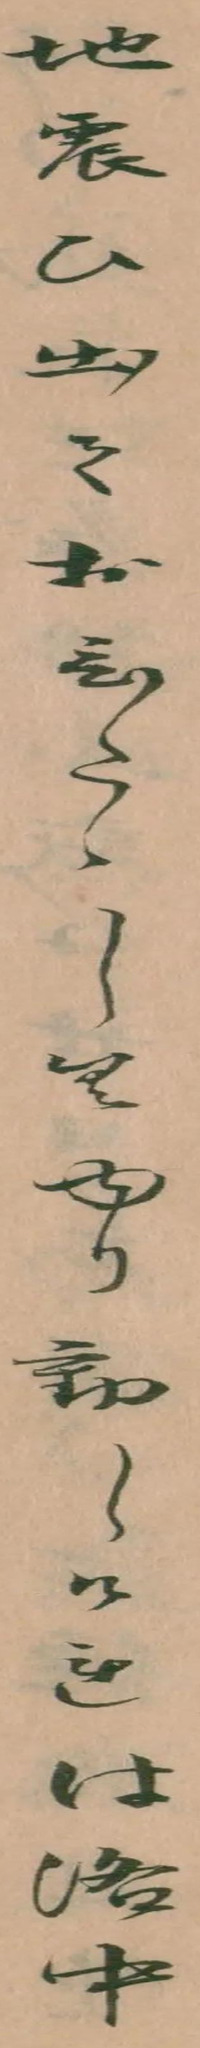地震ひ出ておひたゝしくゆり動しけれは洛中
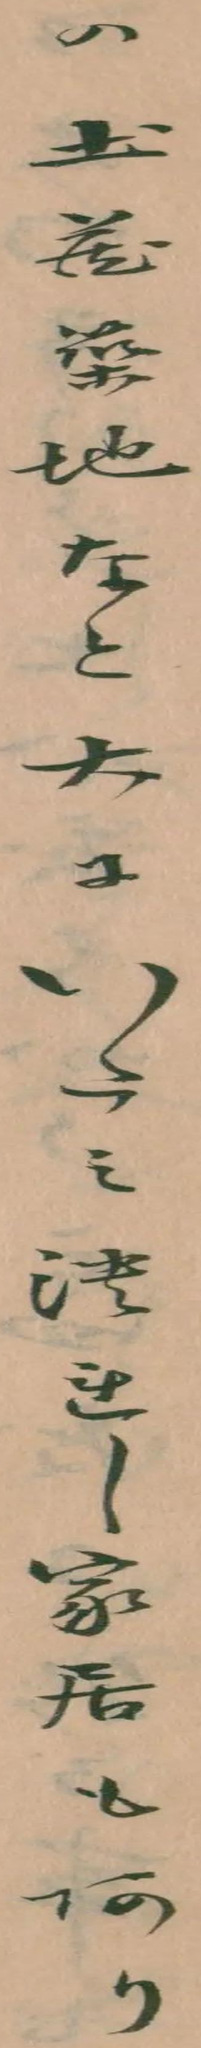の土蔵築地なと大にいたみ潰れし家居もあり
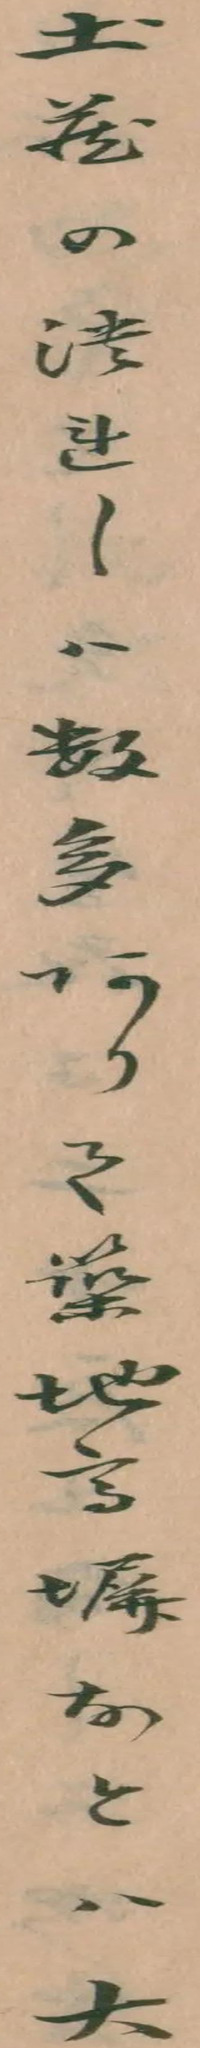土蔵の潰れしは数多ありて築地高塀なとは大
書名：地災撮要. 巻5-6(地震之部)
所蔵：国立国会図書館 National Diet Library, JAPAN
